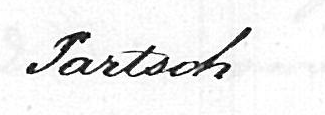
Partsch
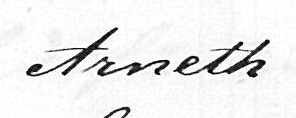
Arneth
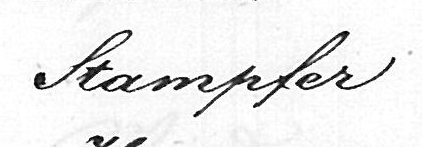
Stampfer
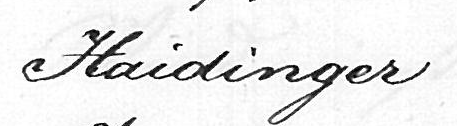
Haidinger
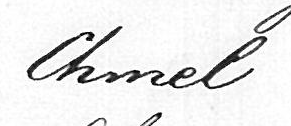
Chmel
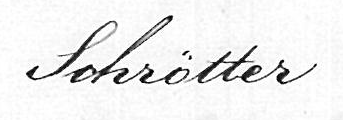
Schrötter
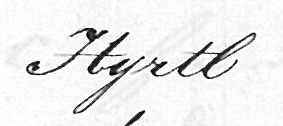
Hyrtl
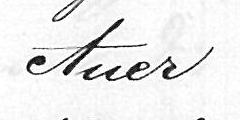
Auer
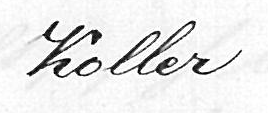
Koller
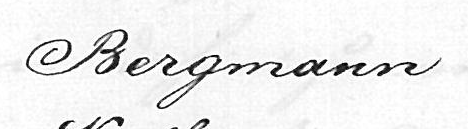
Bergmann
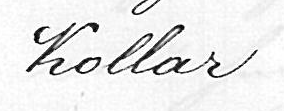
Kollar
